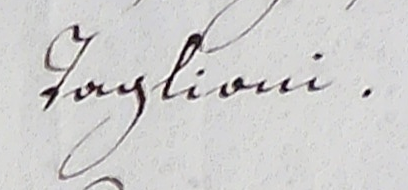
Taglioni.
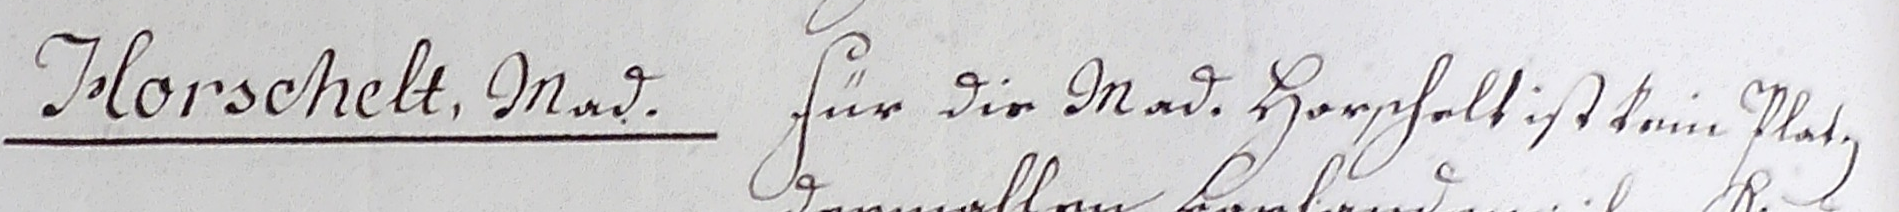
Horschelt, Mad. Für die Mad. Horschelt ist kein Platz
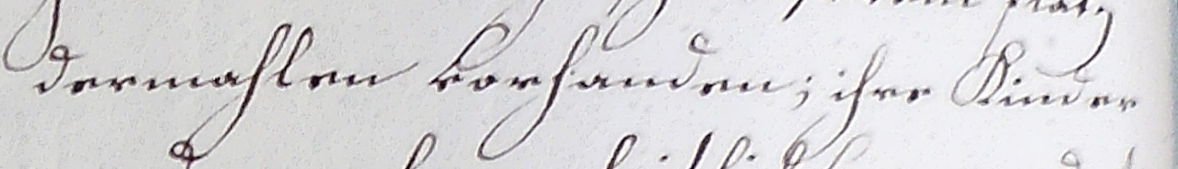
dermahlen vorhanden; ihre Kinder
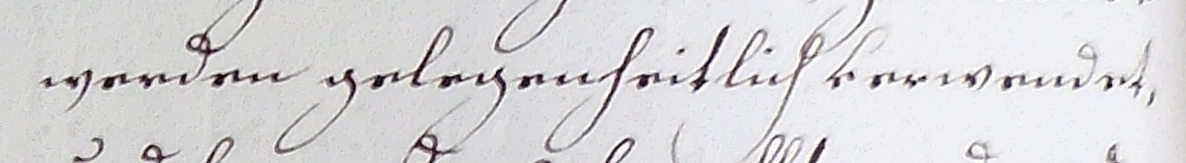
werden gelegenheitlich verwendet,
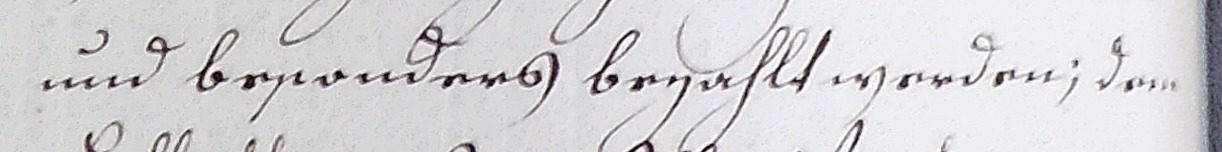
und besonders bezahlt werden; dem
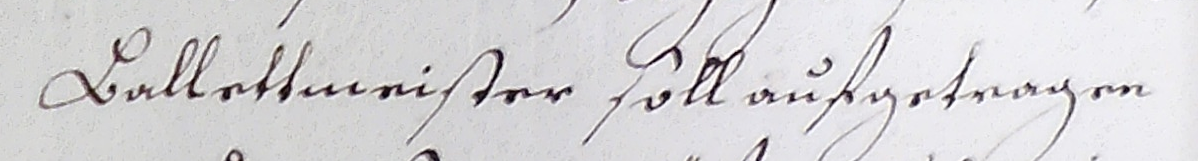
Ballettmeister soll aufgetragen
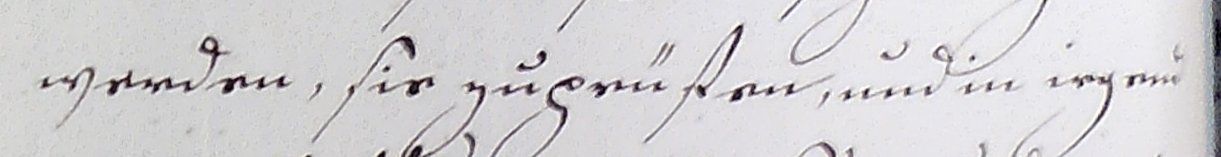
werden, sie zuprüfen, und in irgend
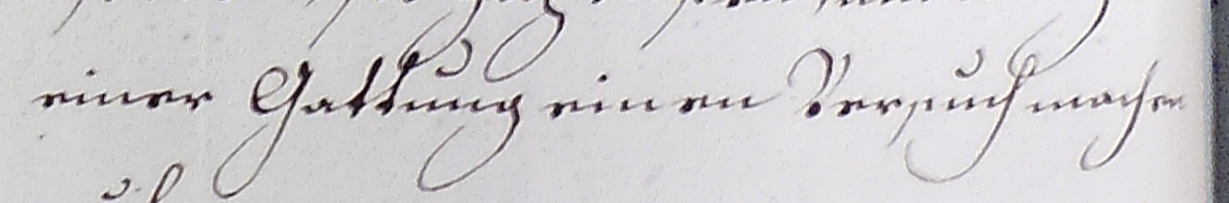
einer Gattung einen Versuch machen
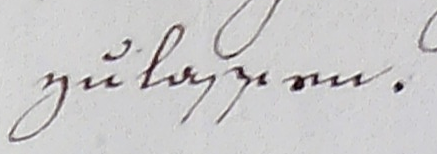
zulassen.
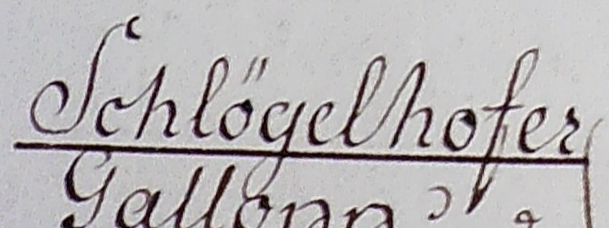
Schlögelhofer
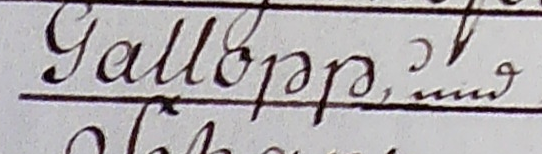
Gallopp, und
